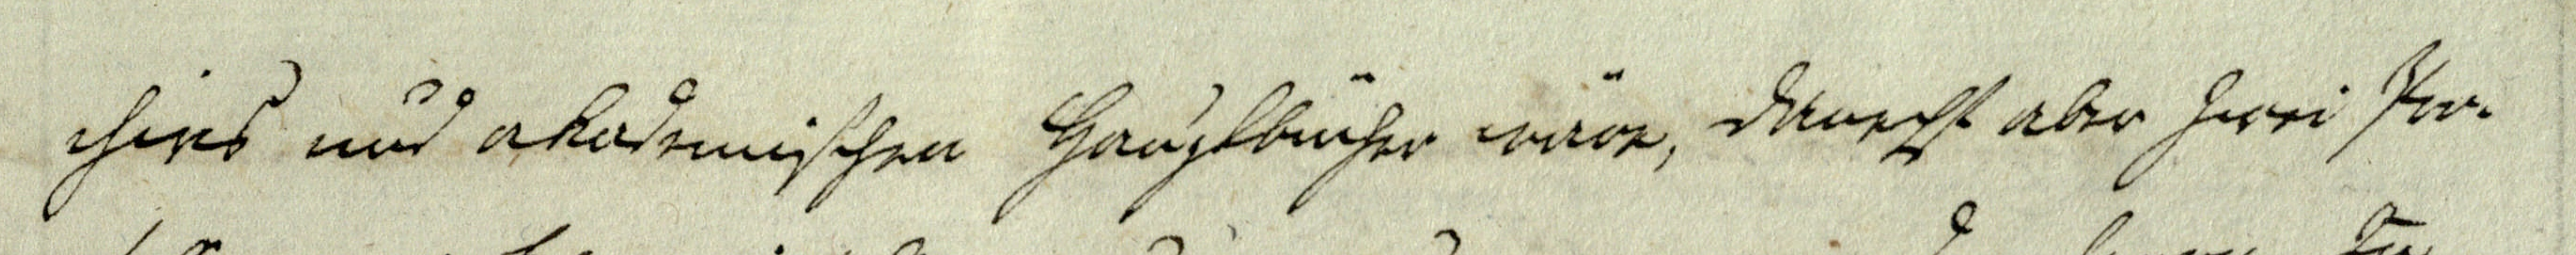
chivs und akademischen Hauptbücher wäre, danechst aber zwei Pro¬
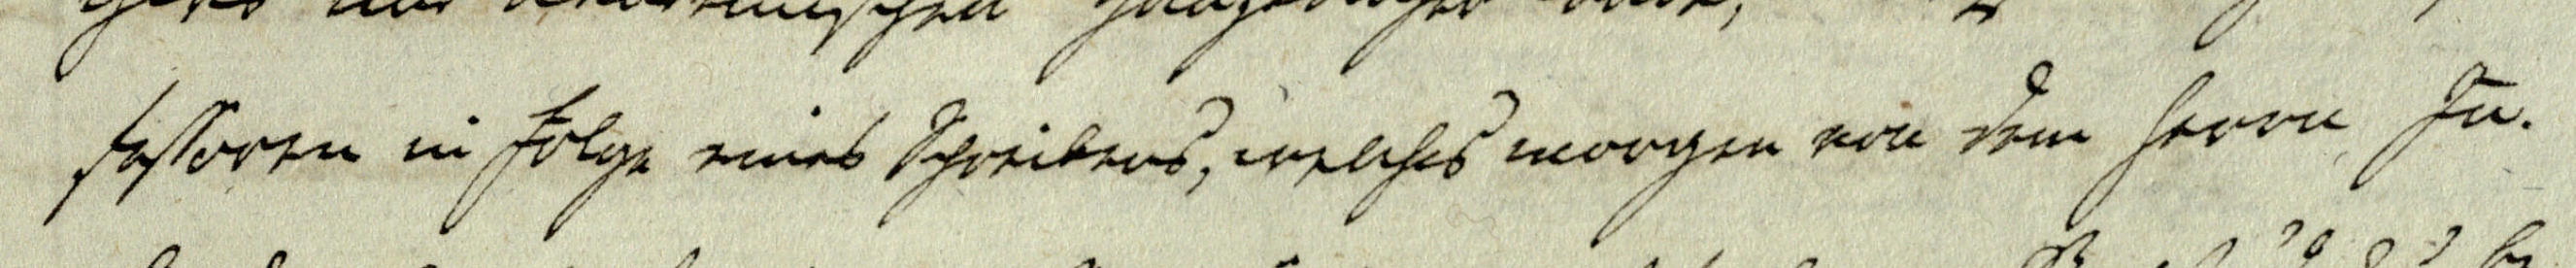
fessoren in Folge eines Schreibens, welches morgen von dem Herrn In¬
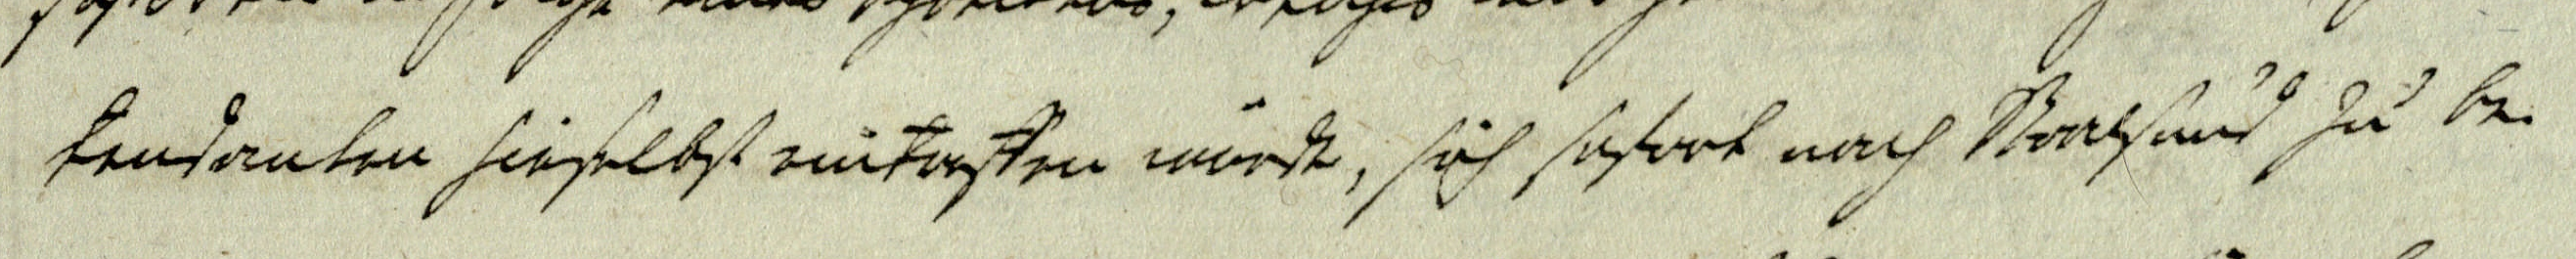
tendanten hieselbst eintreffen würde, sich sofort nach Stralsund zu be¬
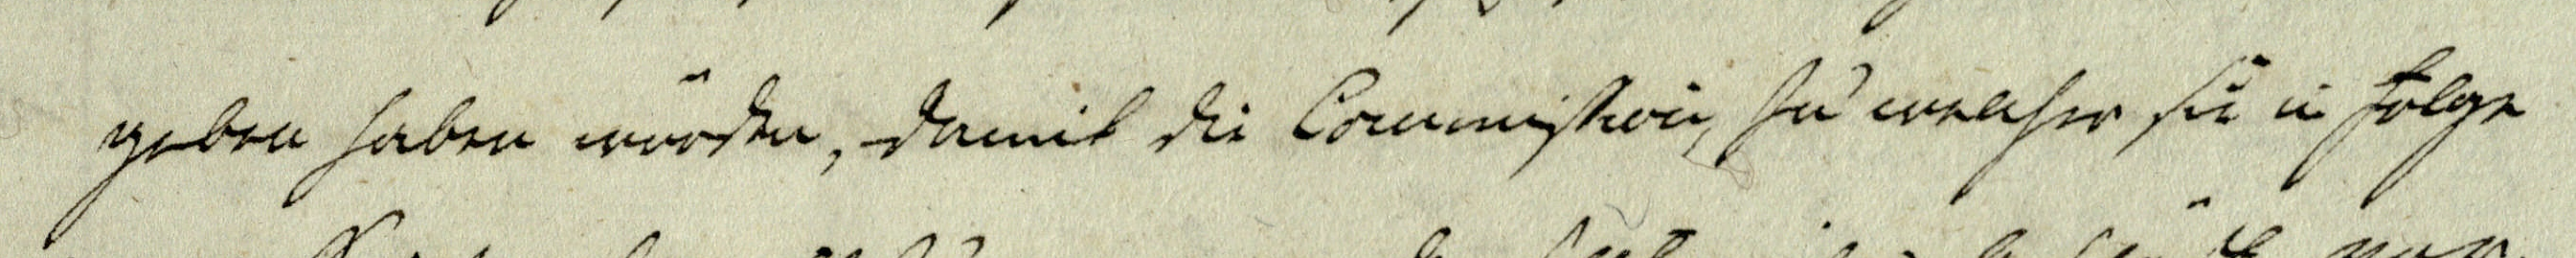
geben haben würden, damit die Commission, zu welcher sie in Folge
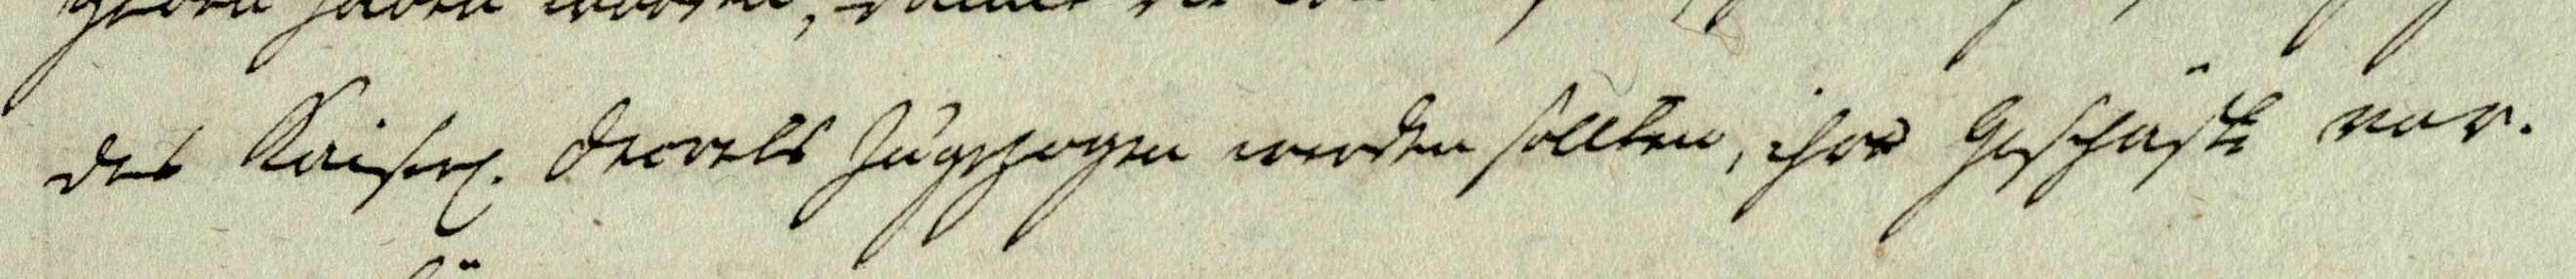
des Kaiser. Decrets zugezogen werden sollten, ihre Geschäfte vor¬
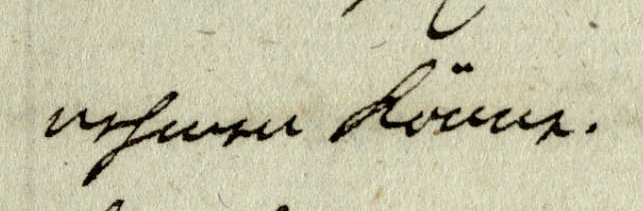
nehmen könne.
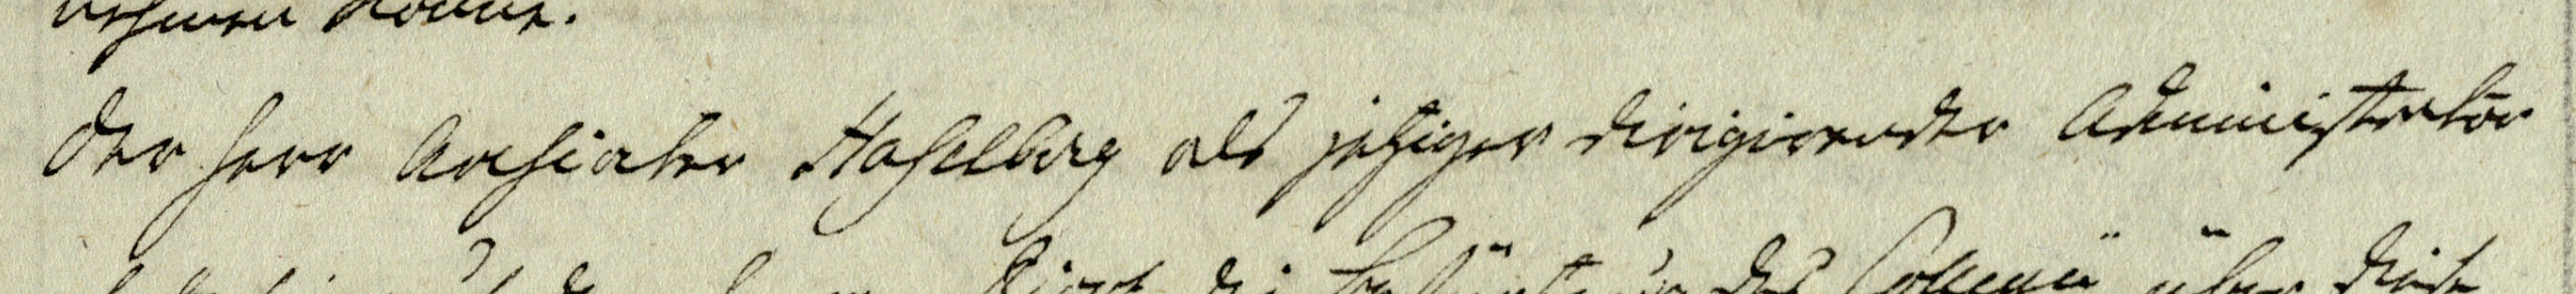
Der Herr Archiater Haselberg als jetziger dirigirender Administrator
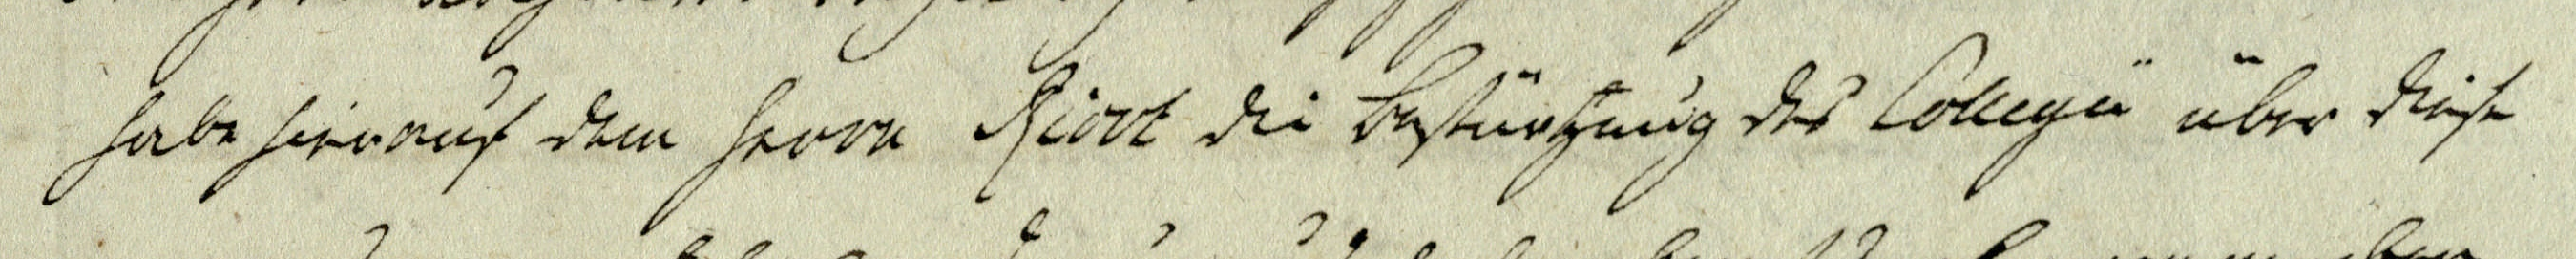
habe hierauf dem Herrn Ricot die Bestürtzung des Collegii über diese
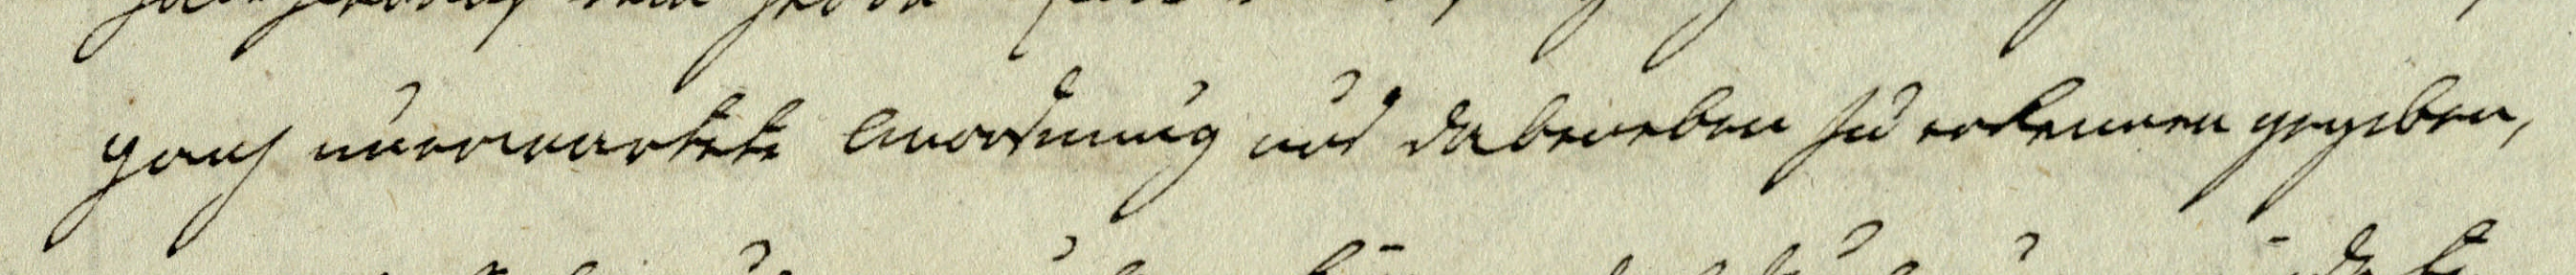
ganz unerwartete Anordnung und dabeneben zu erkennen gegeben,
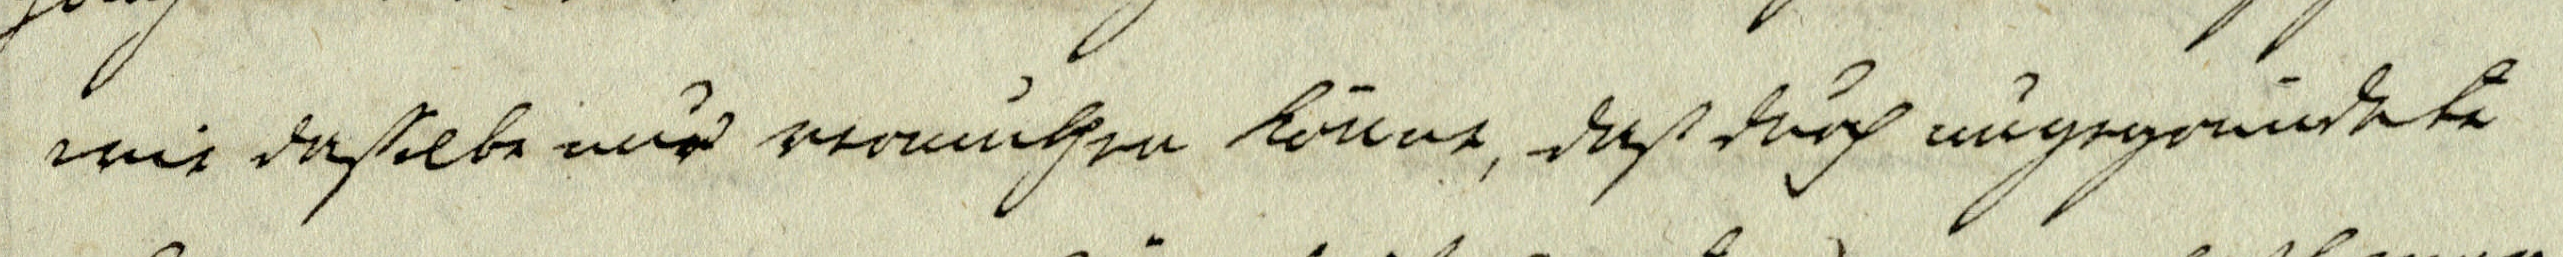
wie dasselbe nur vermuthen könne, daß durch ungegründete
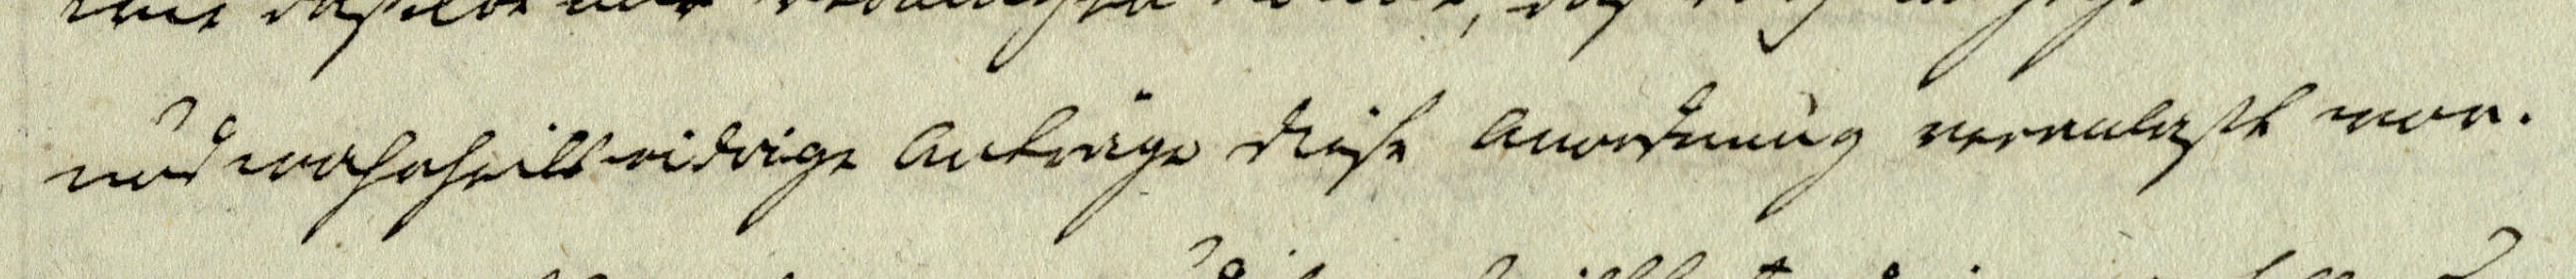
und wahrheitswidrige Anträge diese Anordnung veranlaßt wor¬
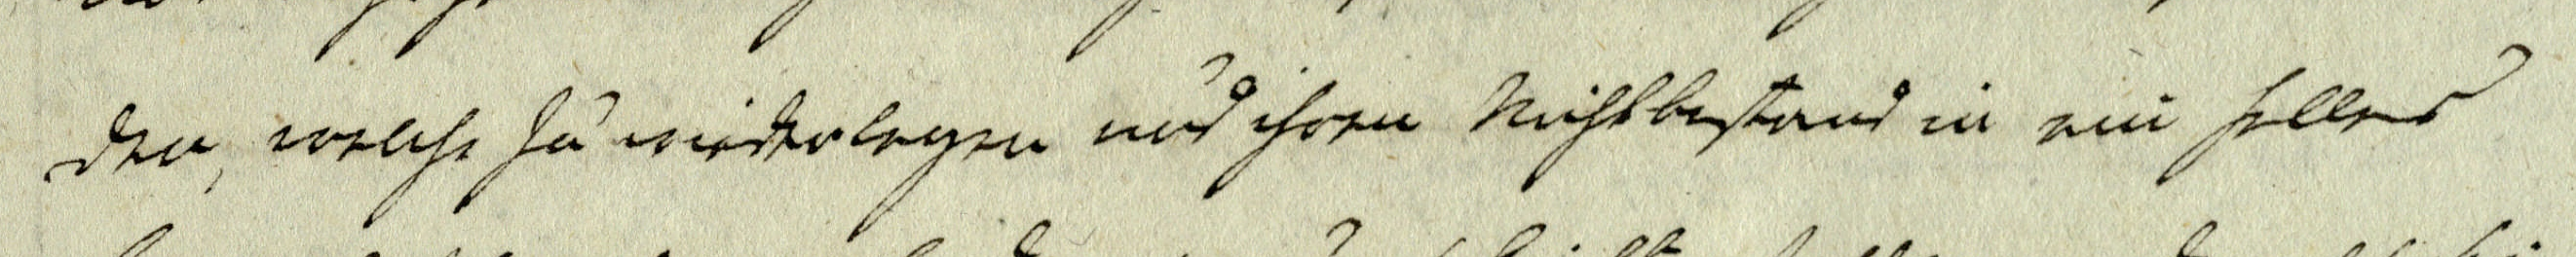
den, welche zu wiederlegen und ihren Nichtbestand in ein helles
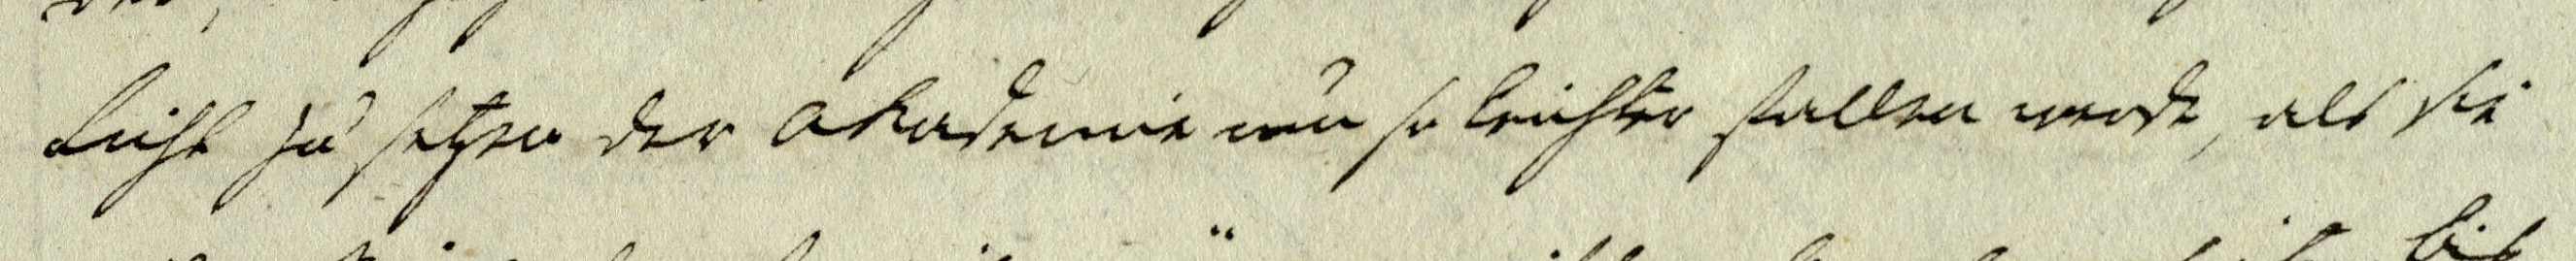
Licht zu setzen der Akademie um so leichter fallen werde, als sie
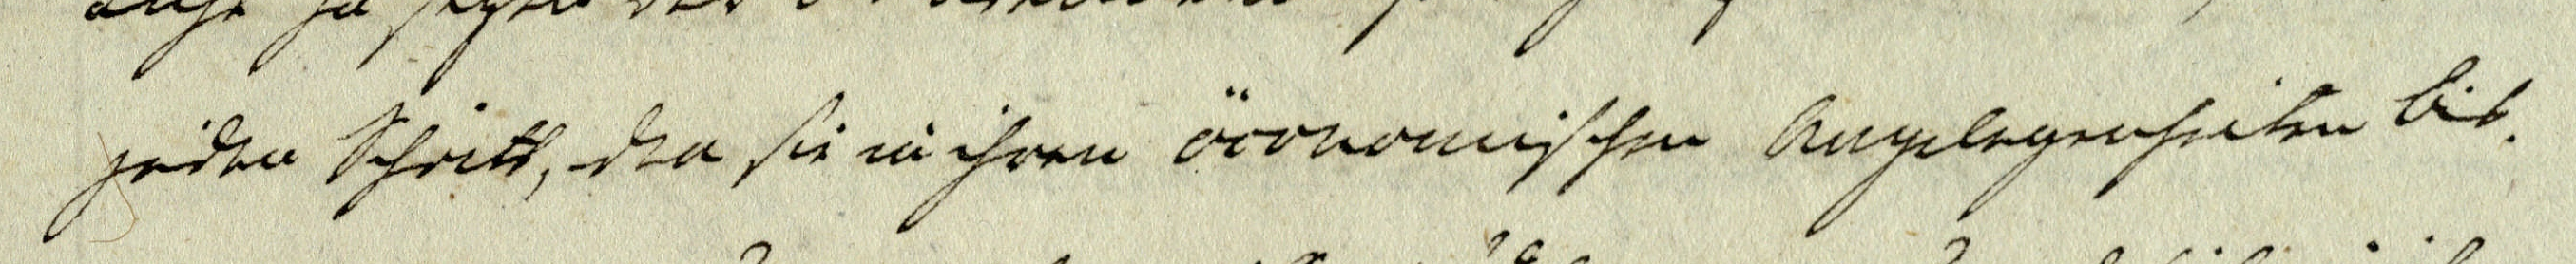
jeden Schritt, den sie in ihren öconomischen Angelegenheiten bis¬
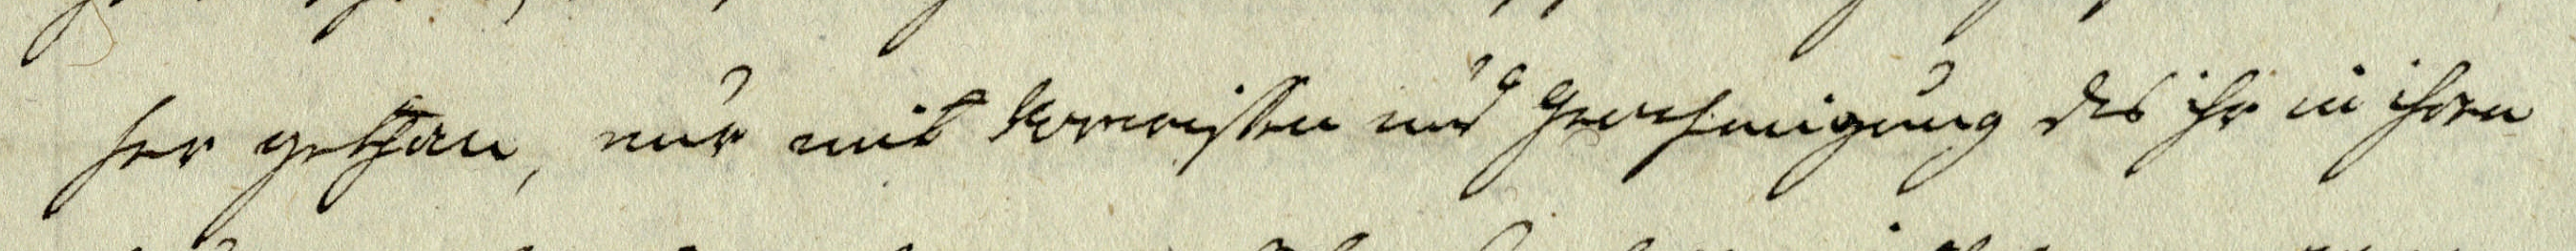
her gethan, nur mit Vorwissen und Genehmigung des ihr in ihren
